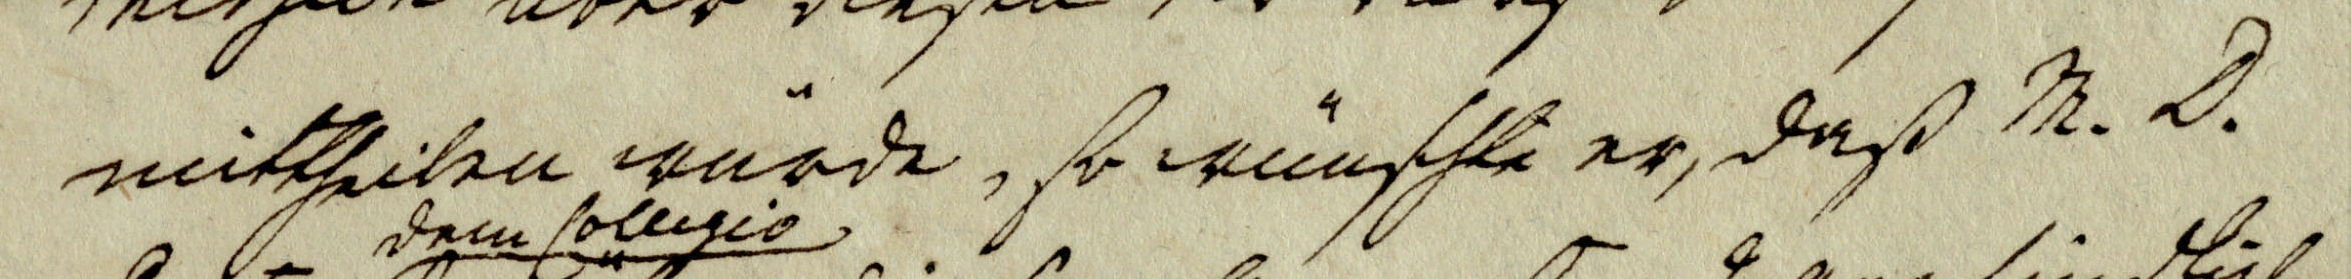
mittheilen würde, so wünschte er, daß M. D.
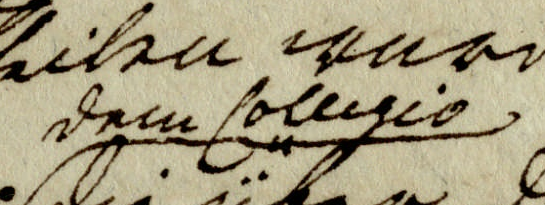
dem Collegio
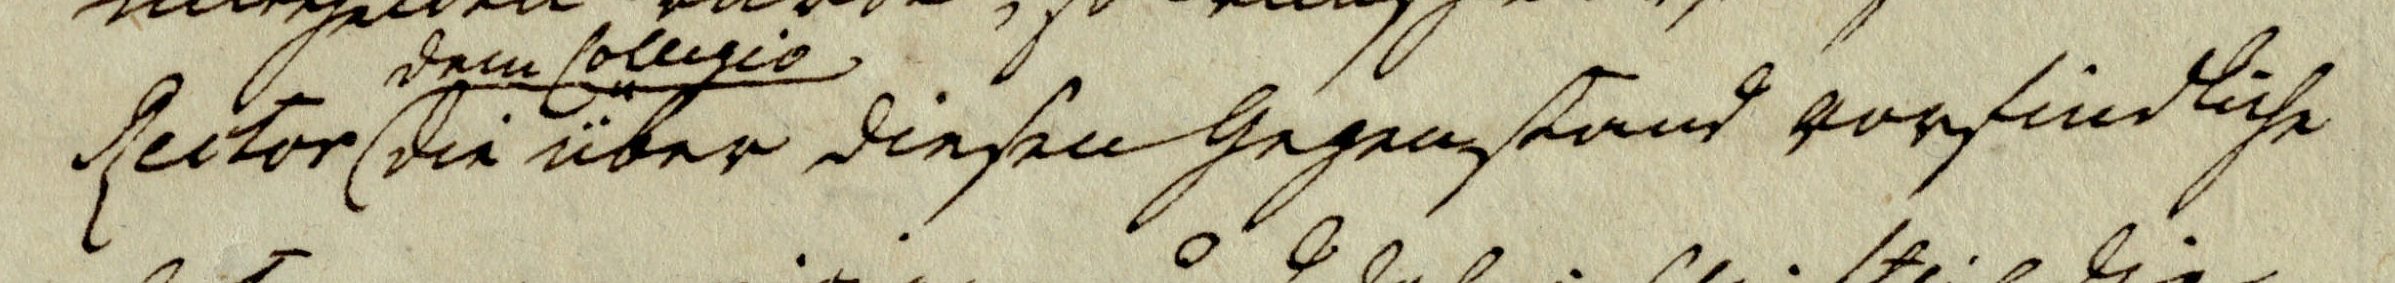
Rector die über diesen Gegenstand vorfindliche
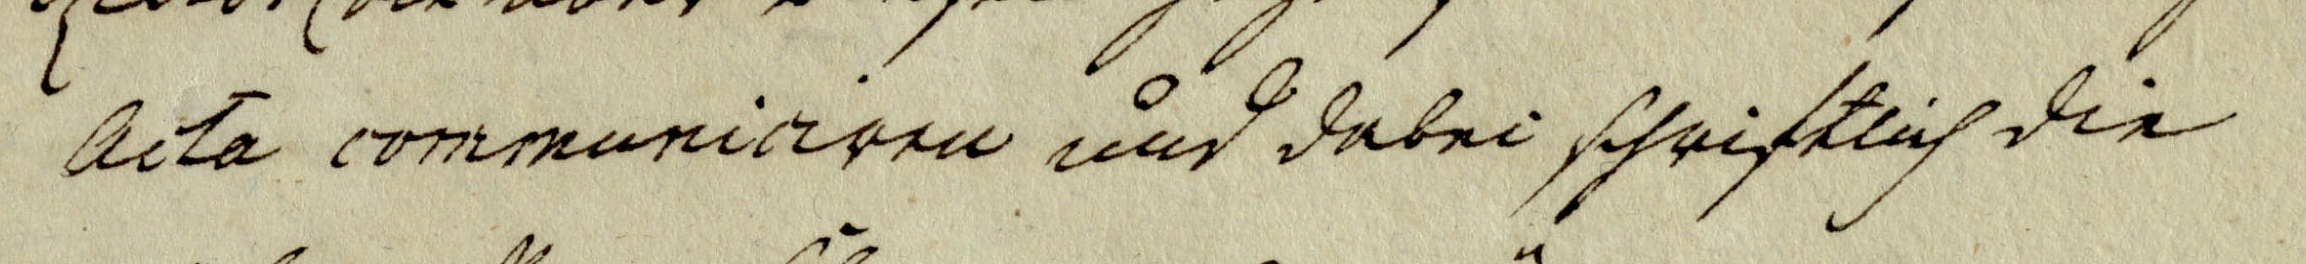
Acta communiciren und dabei schriftlich die
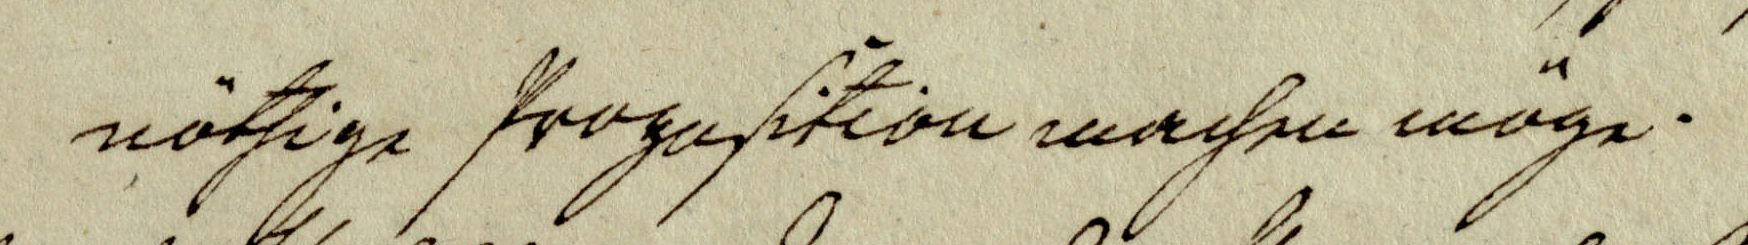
nöthige Proposition machen möge.
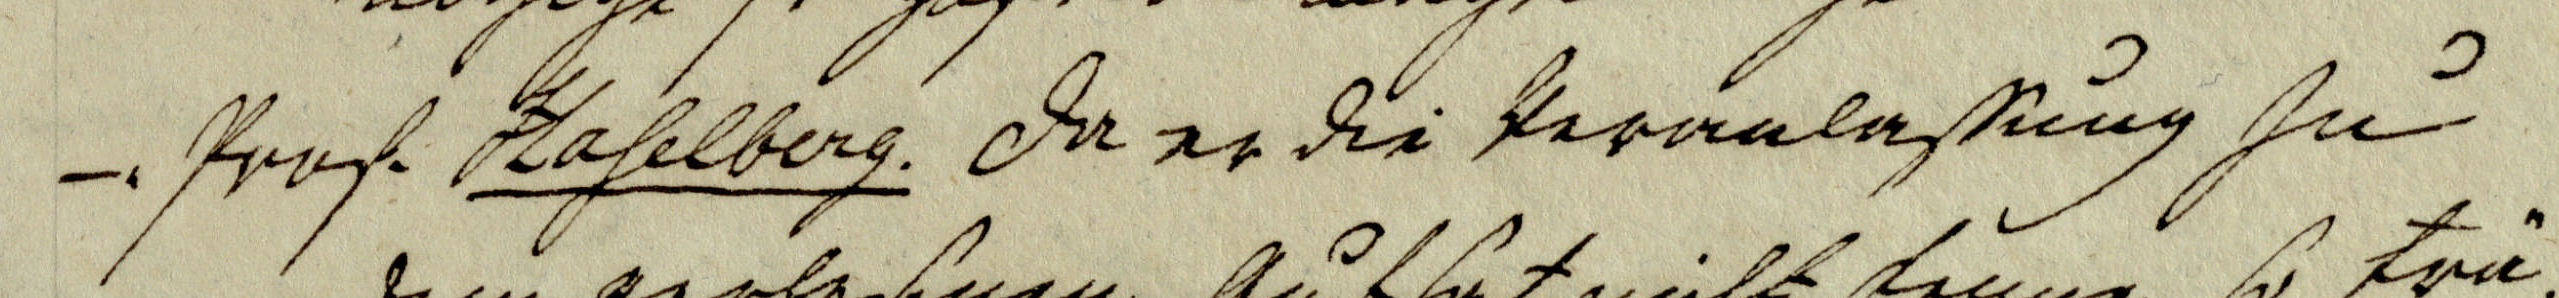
Prof. Haselberg. Da er die Veranlassung zu
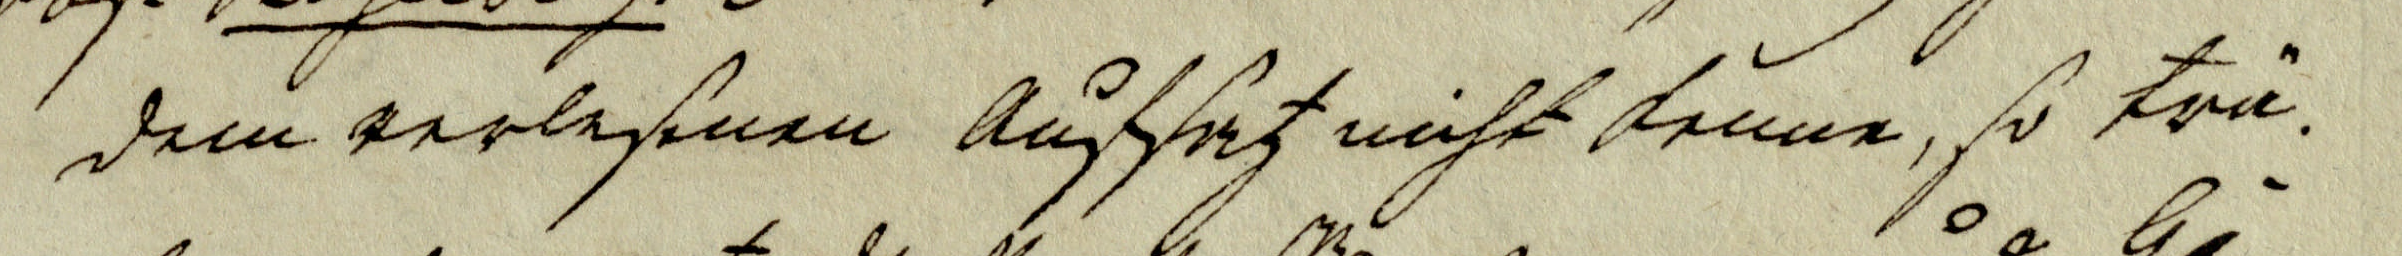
dem verlesenen Aufsatz nicht kenne, so trä¬
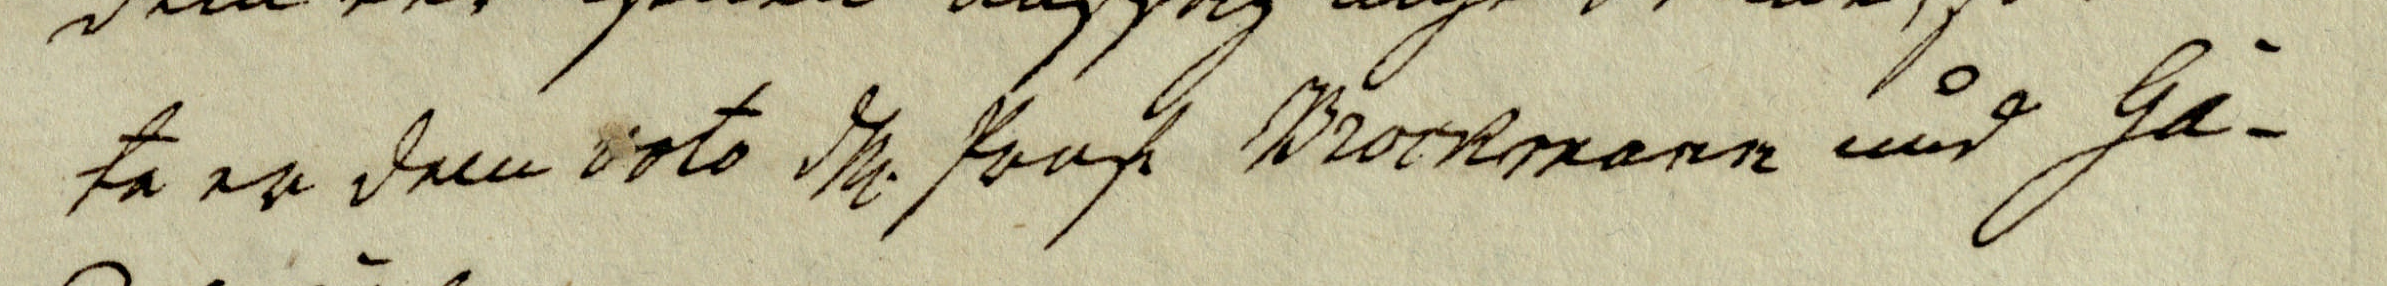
te er dem voto dh. Prof. Brockmann und Ga¬
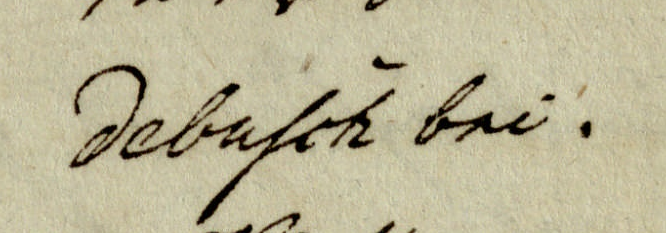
debusch bei.
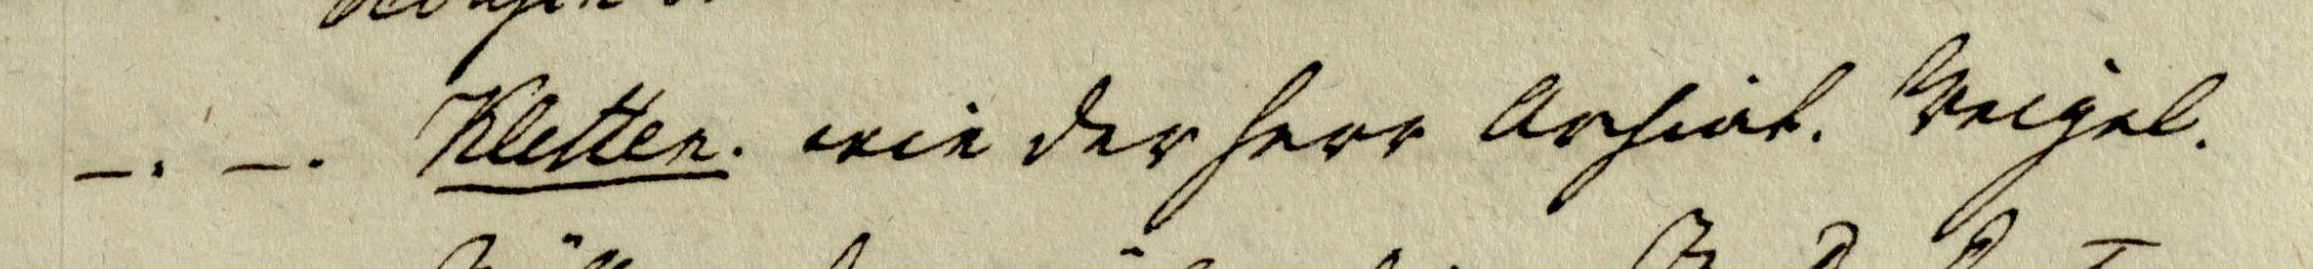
Kletten. wie der Herr Archiat. Weigel.
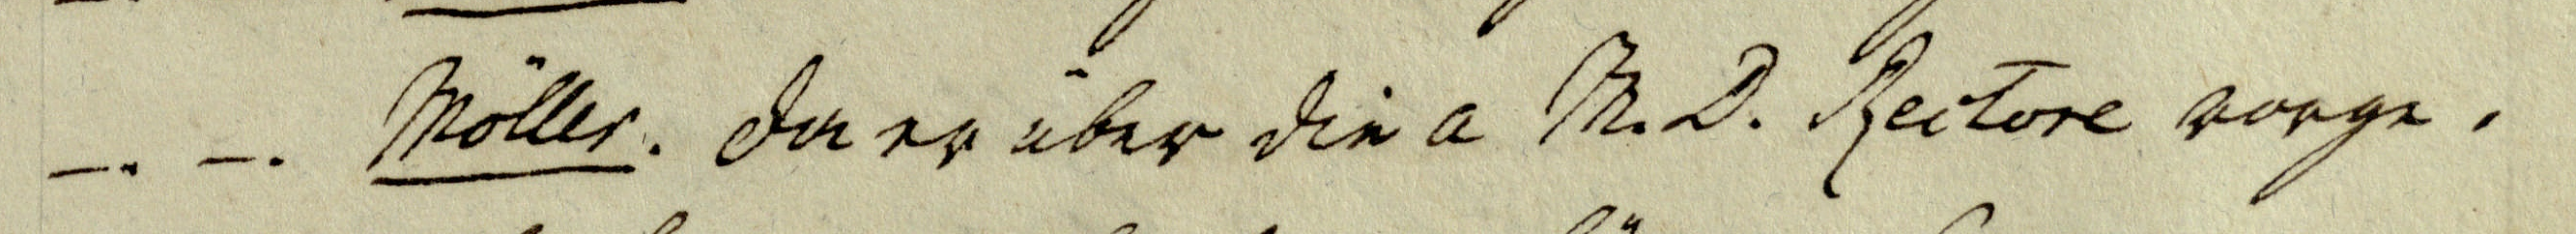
Möller. Da er über die a M. D. Rectore vorge¬
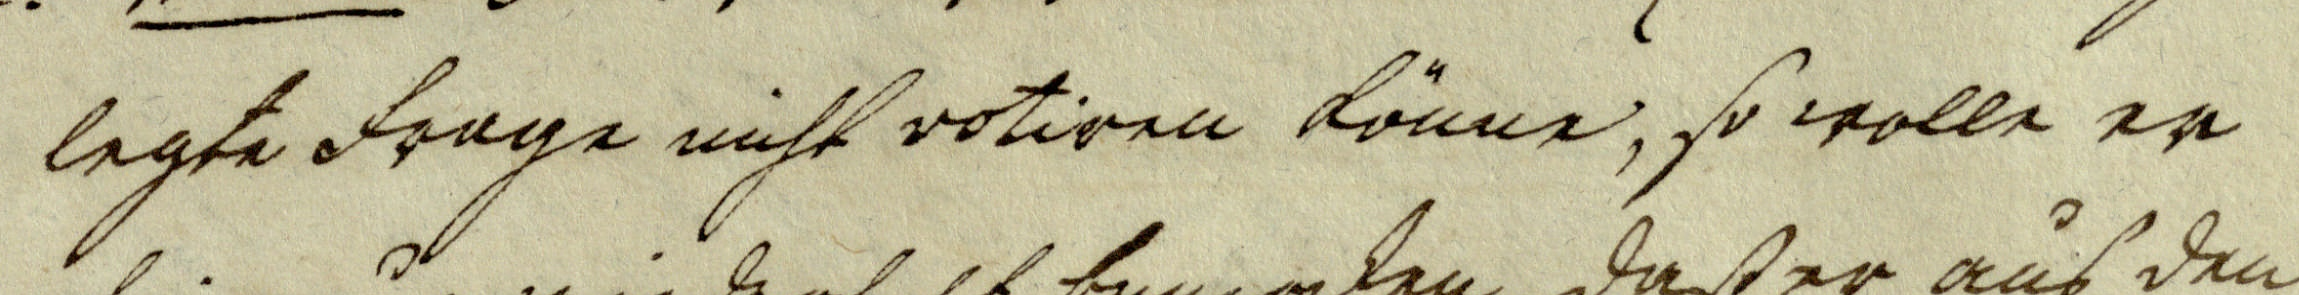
legte Frage nicht votiren könne, so wolle er
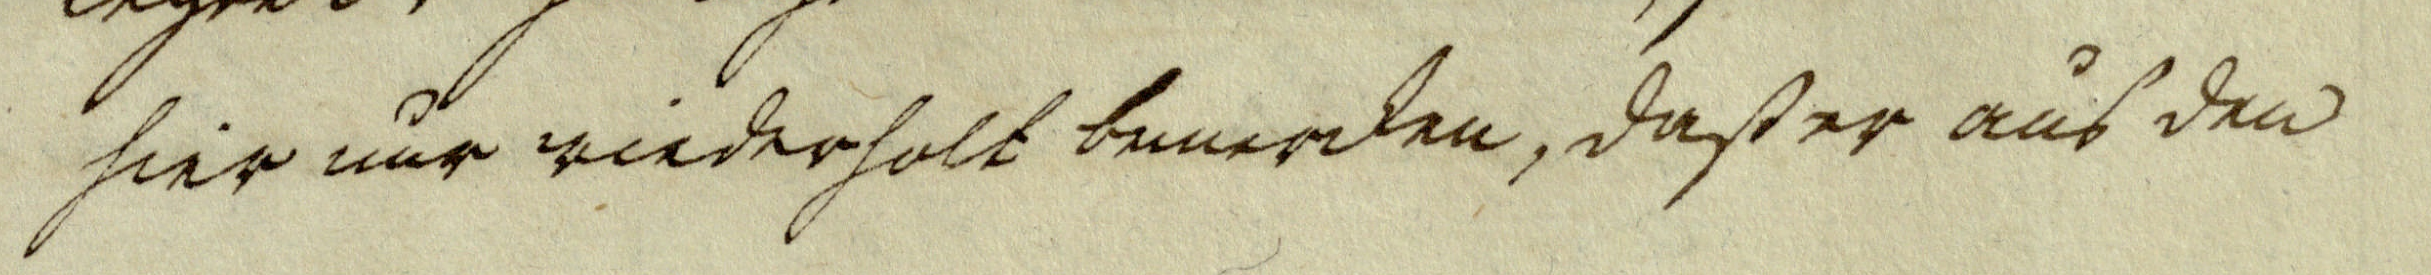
hier nur wiederholt bemercken, daß er aus den
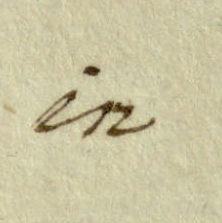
in
